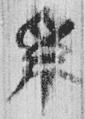奚
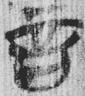言
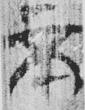不
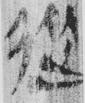從
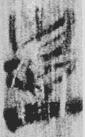豊
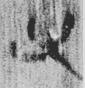又（侑）
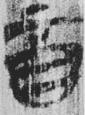酉（酒）
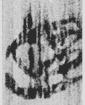○（曾）
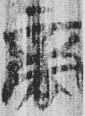商
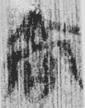高
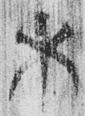木
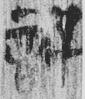訐（衍）
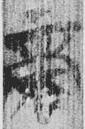商
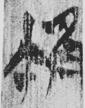{午隹}
